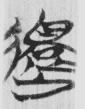還
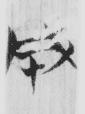成
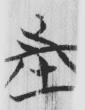市
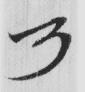乃
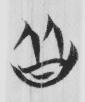皆
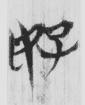好
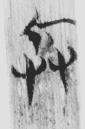兵
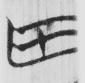甲
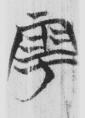𩁹
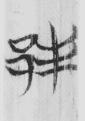邦
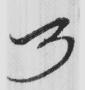乃
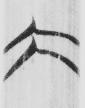大
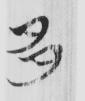多
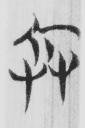兵
